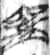寍（寧）
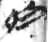於
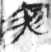寅
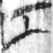工（空）
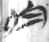於
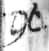卯
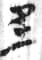坐
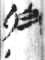於
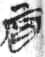晨
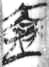盍（蓋）
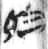於
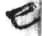巳
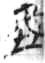城（成）
